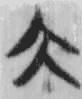大
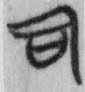司
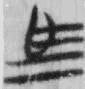馬
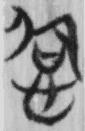○（悼）
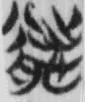○（滑）
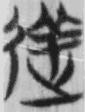𨒫（將）
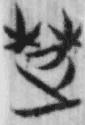楚
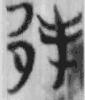邦
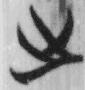之
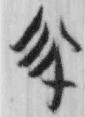帀（師）
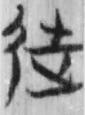徒
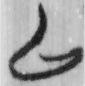㠯（以）
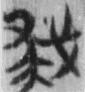○（救）
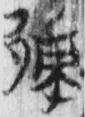郙
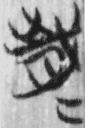歲
